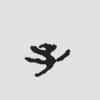子
